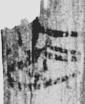○（來）
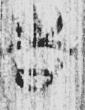告
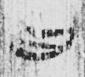曰
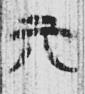亓
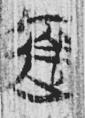𨒫（將）
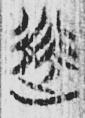○（帥）
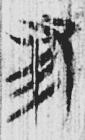○（盡）
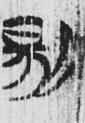○（傷）
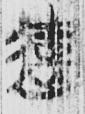連
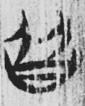皆
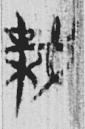栽
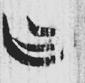曰
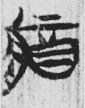𨟻（將）
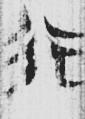行
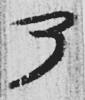乃
